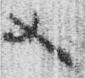又（有）
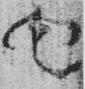它
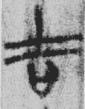吉
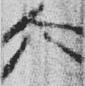六
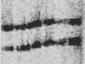二
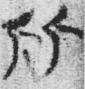比
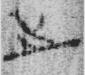之
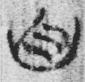自
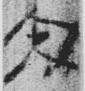內
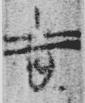吉
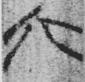六
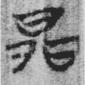晶（三）
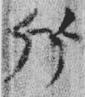比
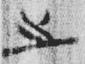之
